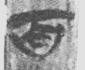百
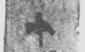十
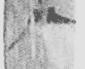八
